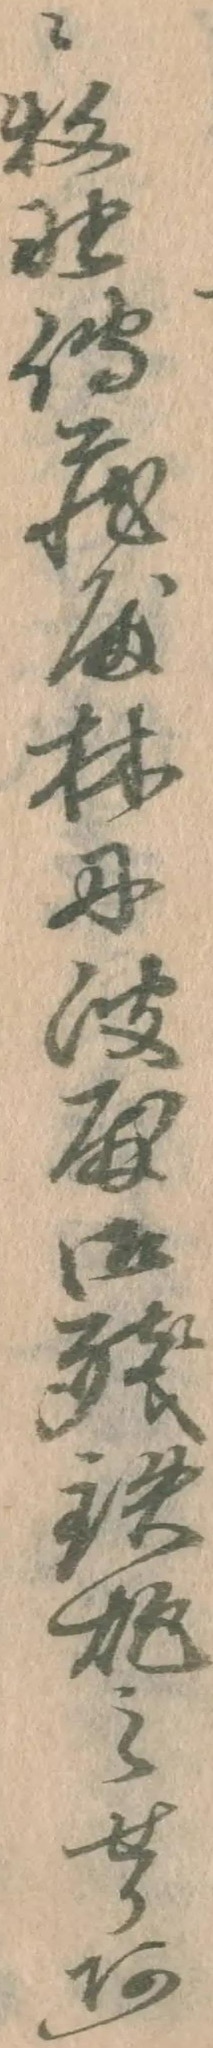に牧野伝蔵殿林丹波殿御残鉄炮之せり阿
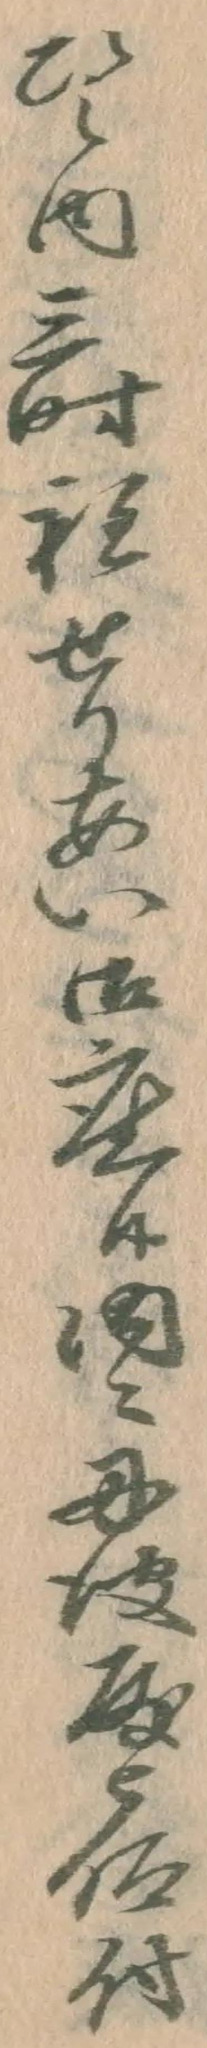ひ之内三時程せりあい御座候内に丹波殿被仰付
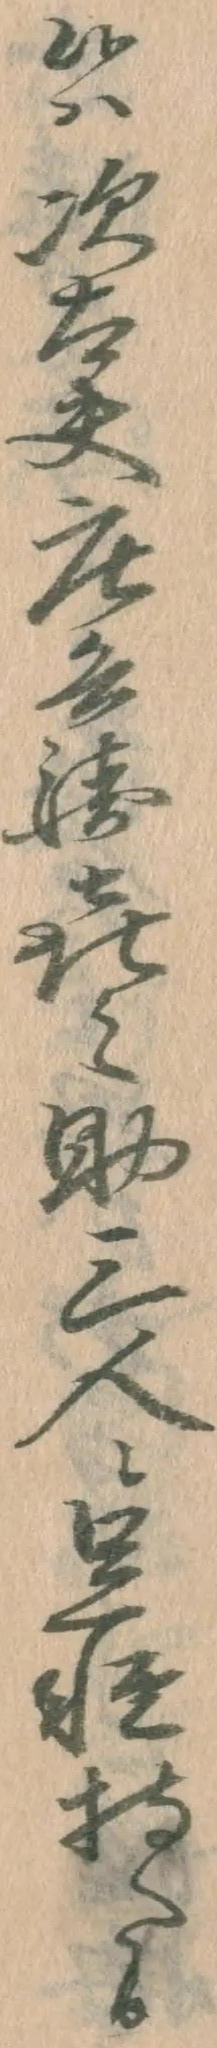候は次太夫庄兵衛喜之助三人に足軽持たる
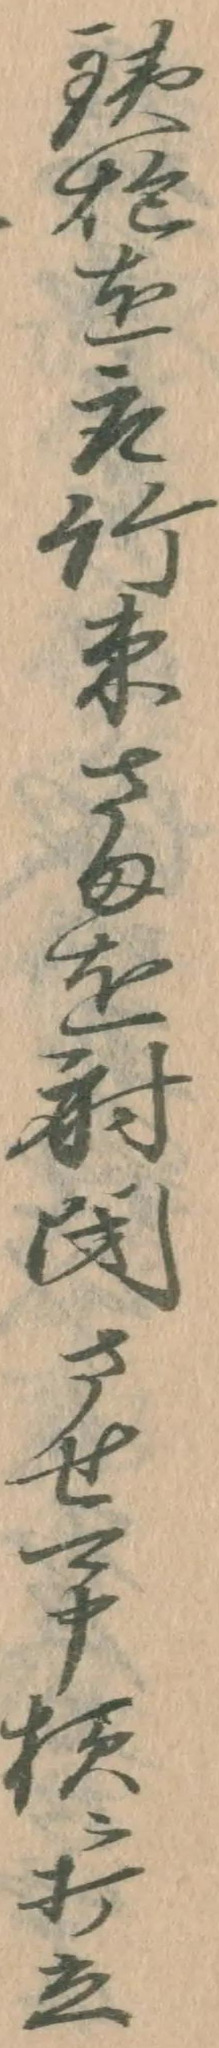鉄炮を取竹束さまを射閉させ可申様に打立
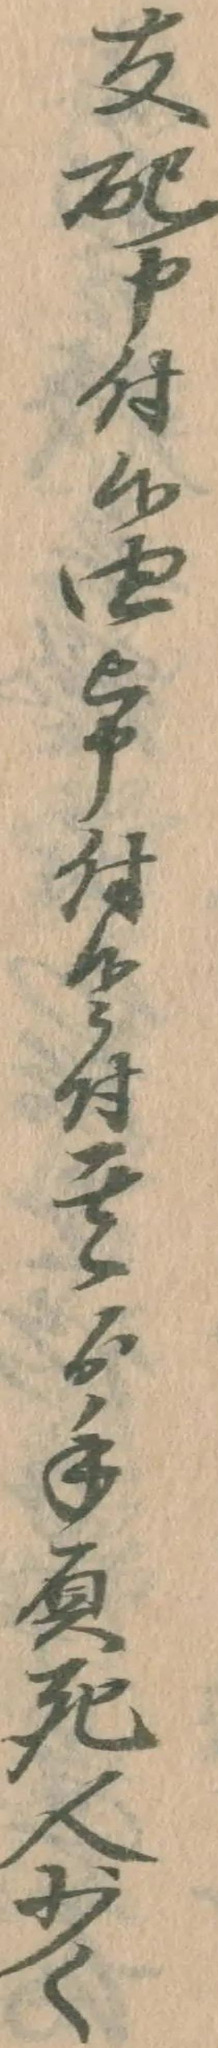支配申付候由被申付候に付其ゟ手負死人少く
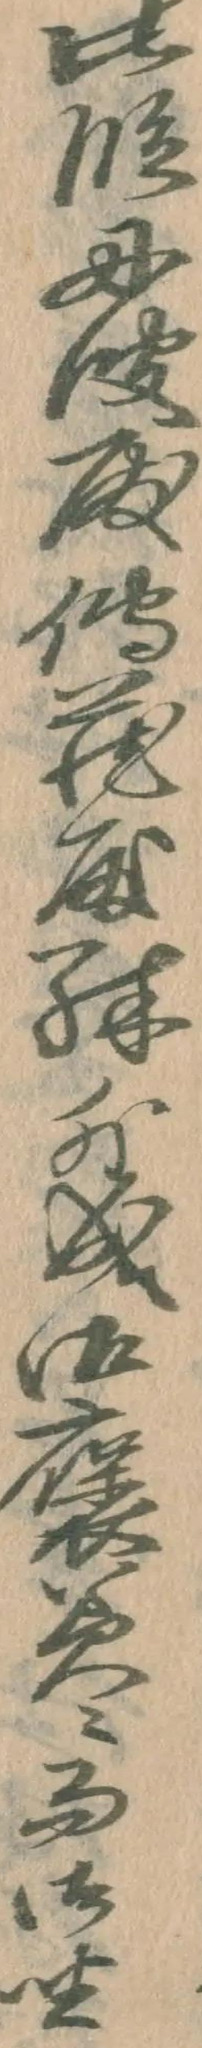此段丹波殿伝蔵殿殊外成御褒美に而御坐
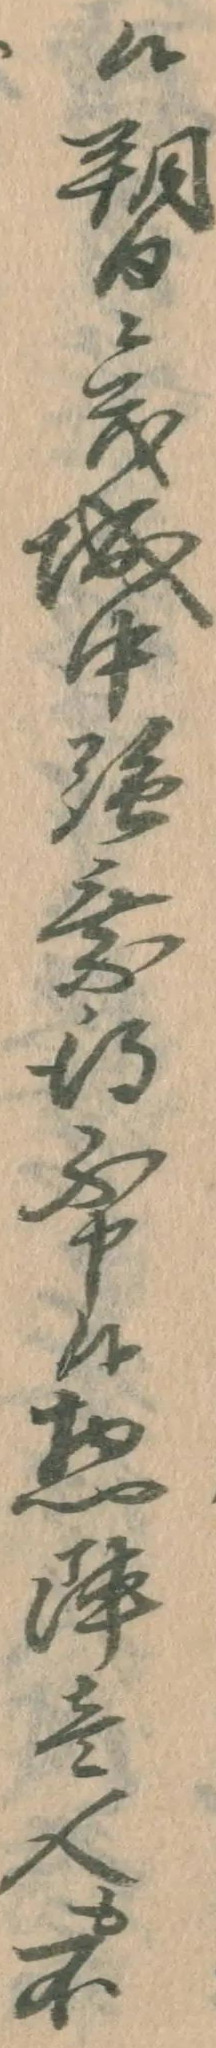候朔日に茂城中強乗得ふ申候惣陣壱人も不
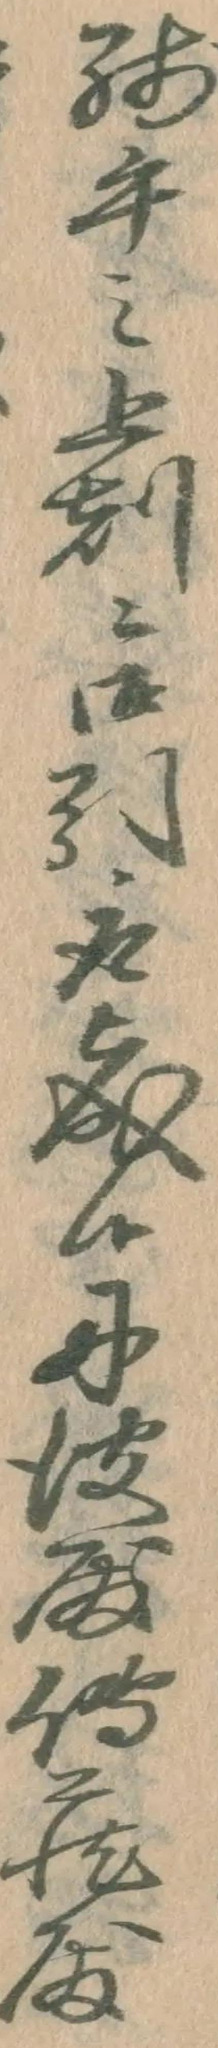残午之上刻に御引取被成候丹波殿伝蔵殿
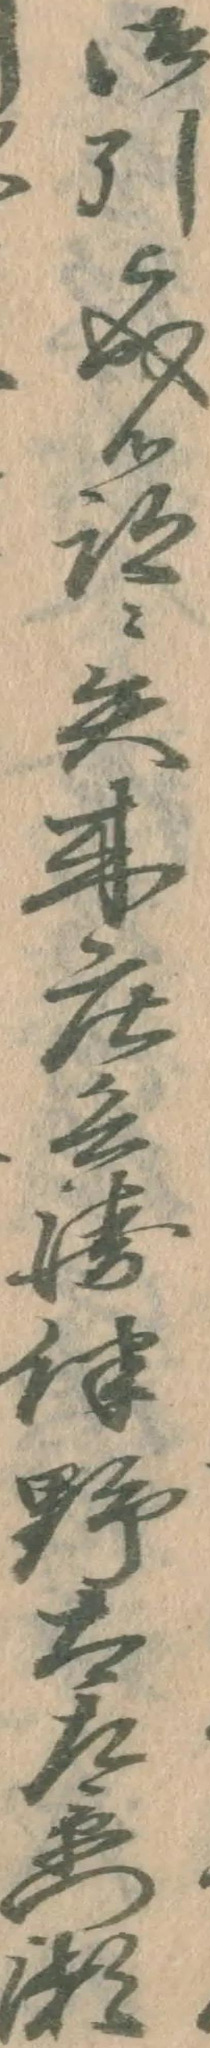御引被成候跡に矢来庄兵衛伴野太左衛門瀬
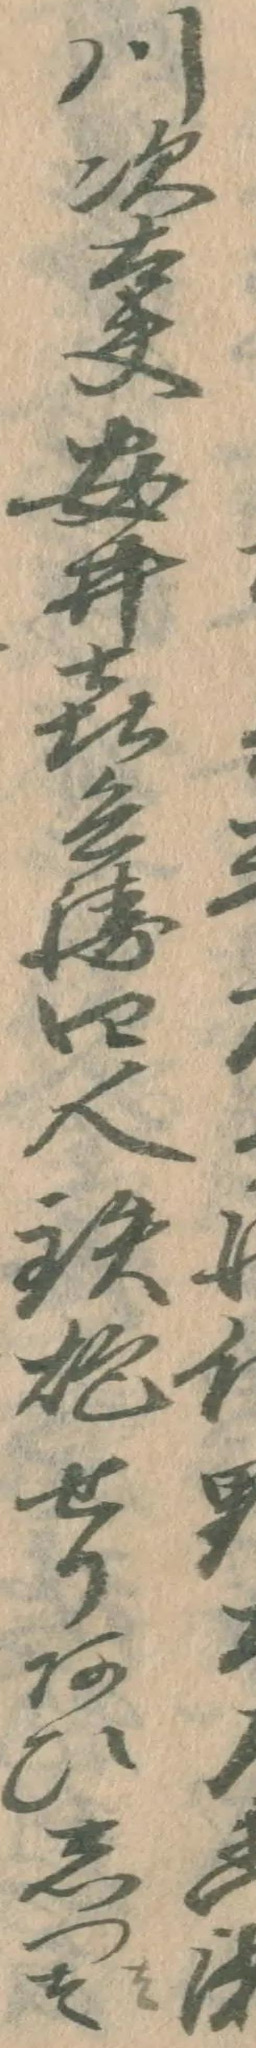川次太夫安井喜兵衛四人鉄炮せり阿ひ志つ者
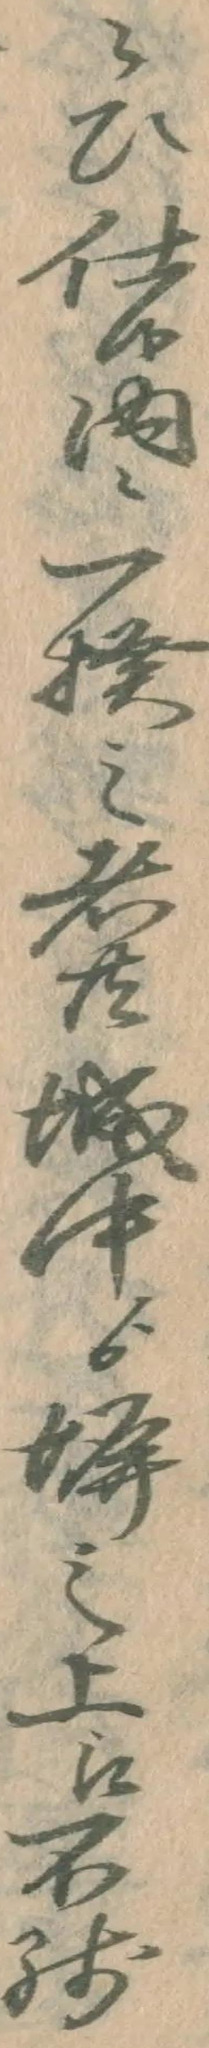らひ仕候内に一揆之者共城中ゟ塀之上江不残
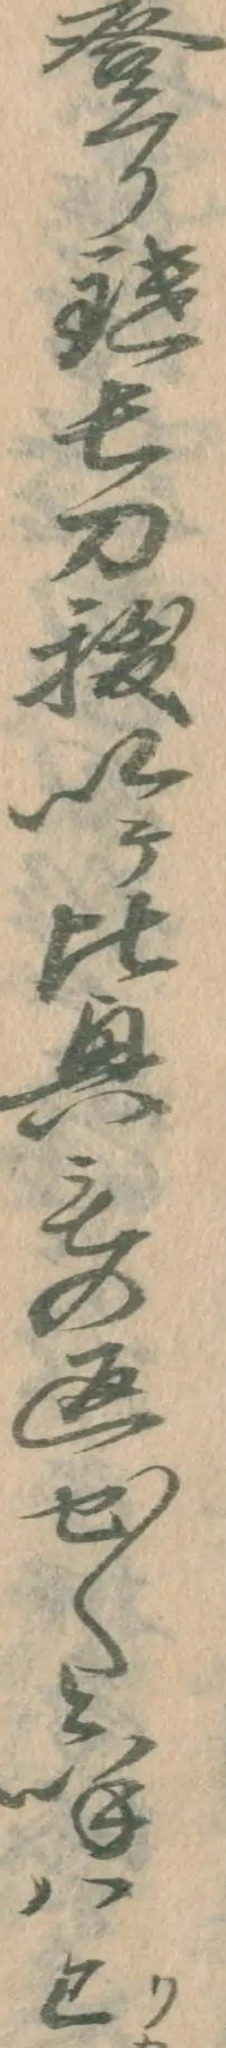登り鑓長刀抜以て比奥もの返せ〳〵と呼は里
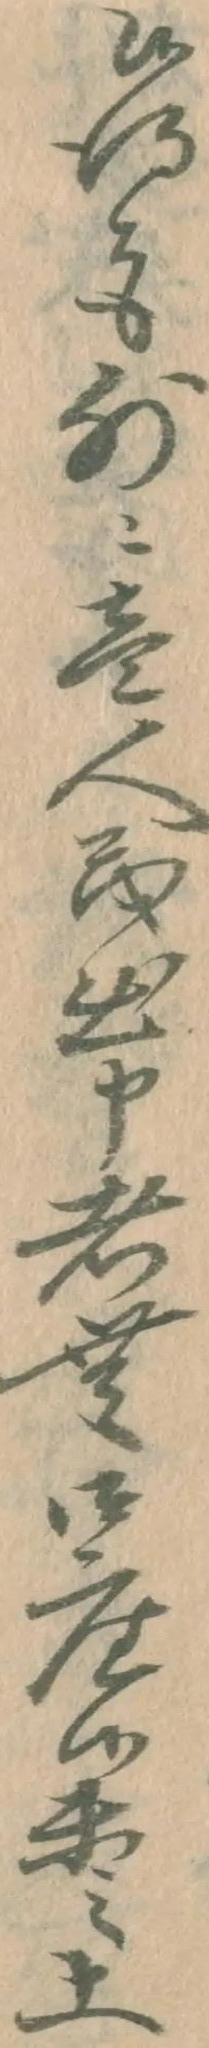候得にも外に壱人茂出申者無御座候未之上

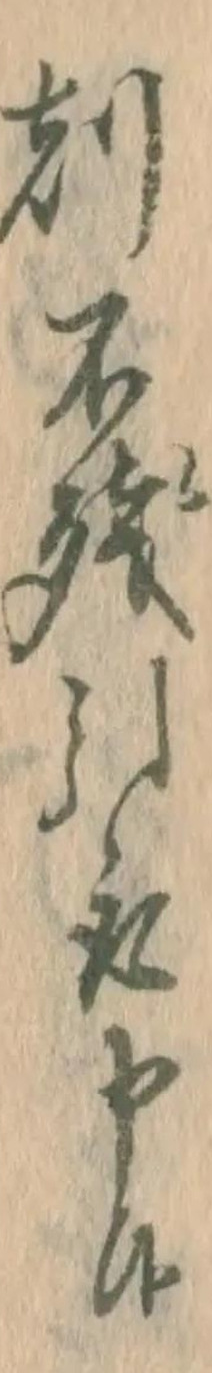刻不残引取申候
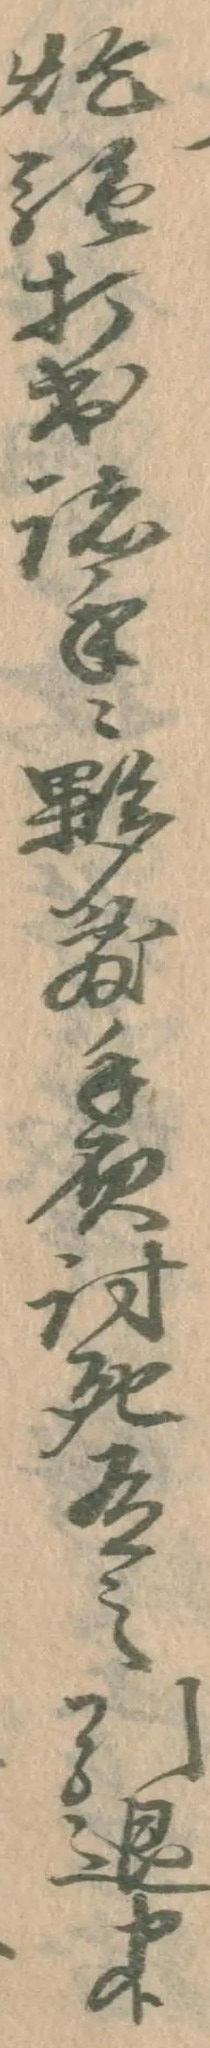炮鑓打出諸手に夥敷手負討死有之引退申候
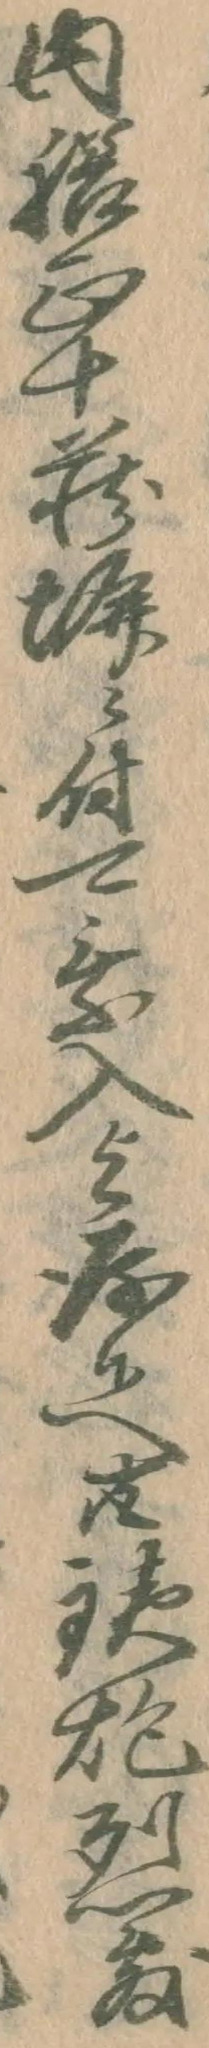内膳正十蔵塀に付可乗入与存候へ共鉄炮烈敷
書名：切支丹御退治記 49巻. [5]
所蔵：国立国会図書館 National Diet Library, JAPAN
